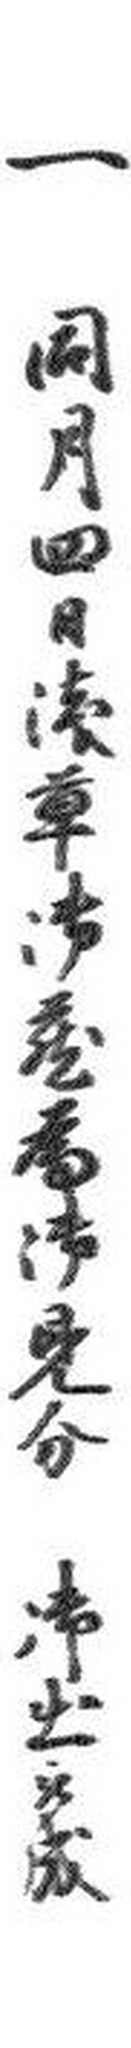一同月四日浅草御蔵為御見分御出被成
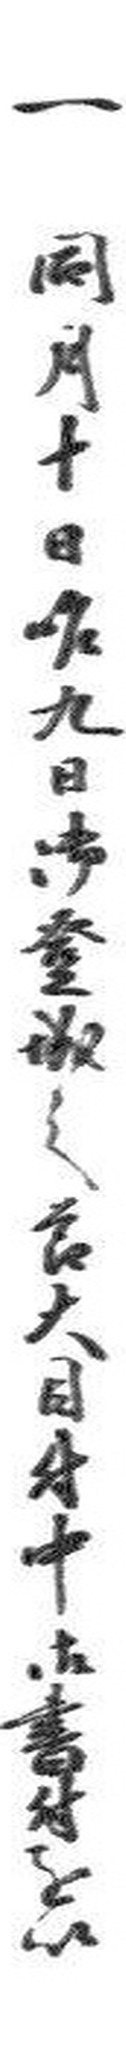一同月十日昨九日御登城之節大目付中御書付を以

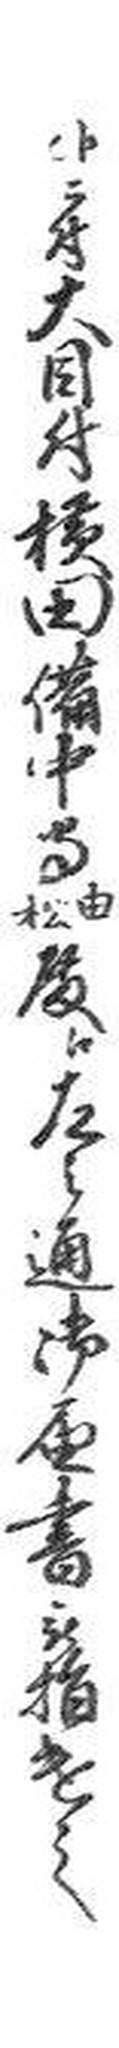候ニ付大目付横田備中守由松殿江左之通御届書被指遣之
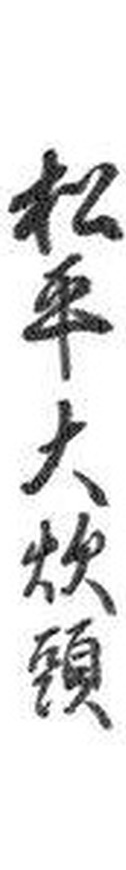松平大炊頭
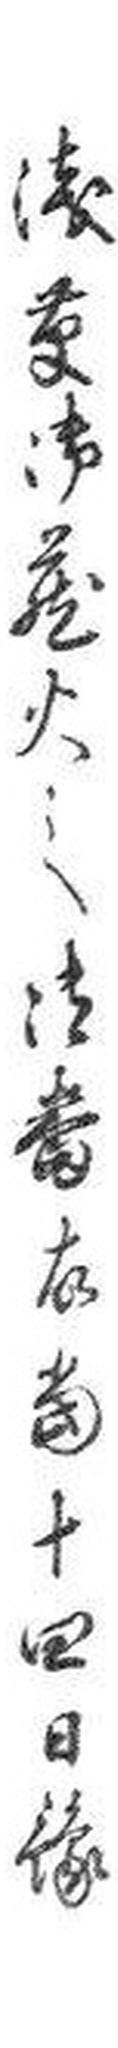浅草御蔵火之御番故当十四日予
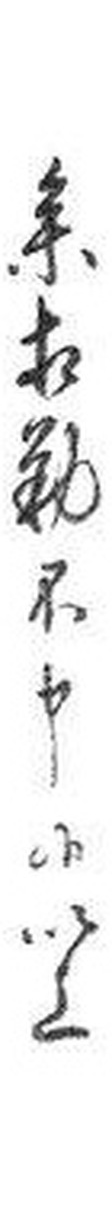参相勤不申候以上
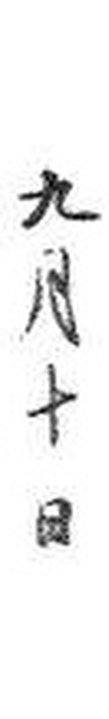九月十日
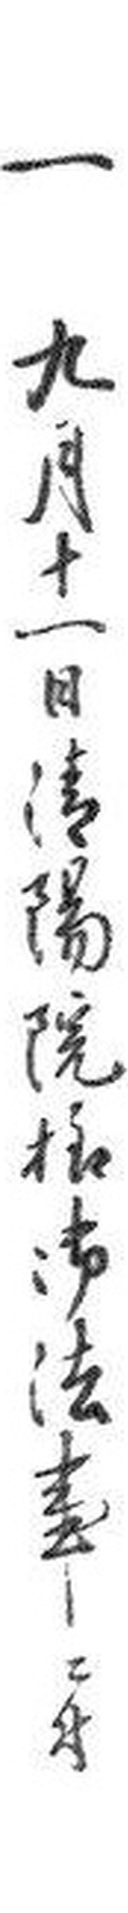一九月十一日清陽院様御法事ニ付
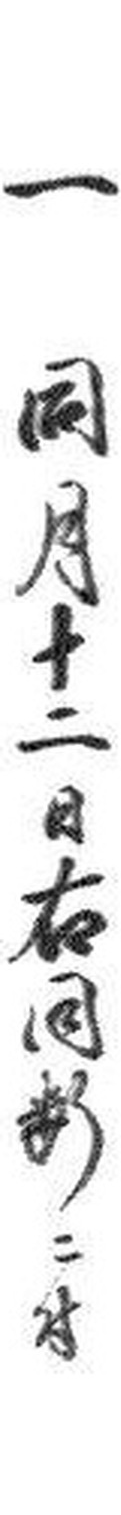一同月十二日右同断ニ付
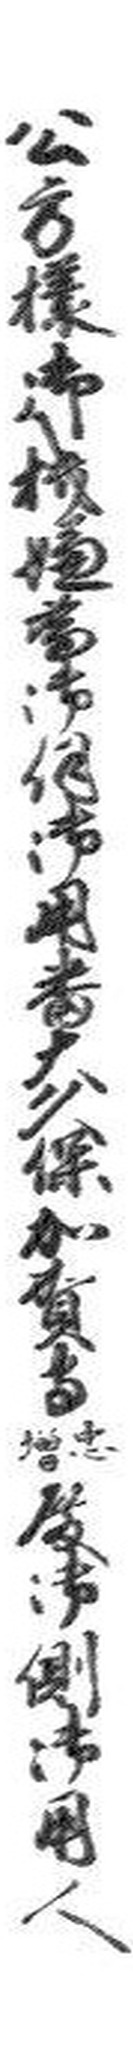公方様御機嫌為御伺御用番大久保加賀守忠増殿御側御用人
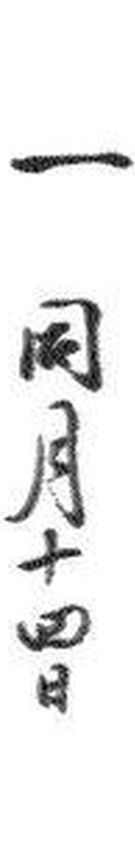一同月十四日
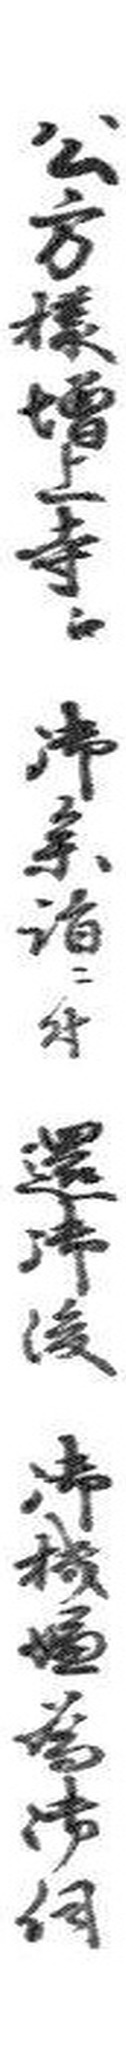公方様増上寺江御参詣ニ付還御後御機嫌為御伺
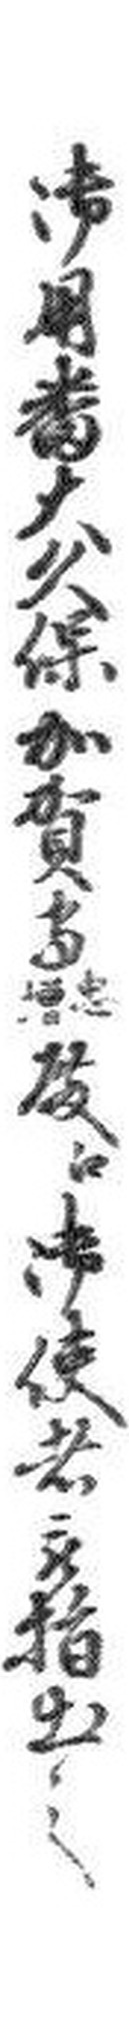御用番大久保加賀守忠増殿江御使者被指出之
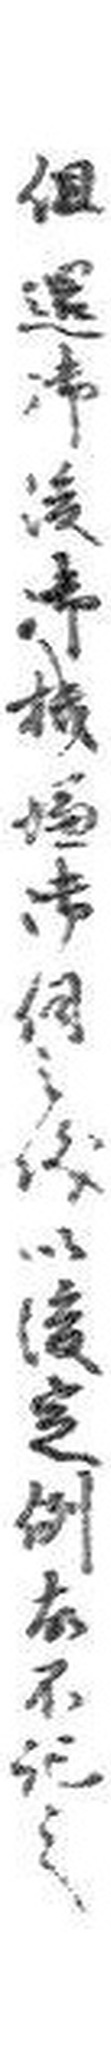但還御後御機嫌御伺之儀以後定例故不記之
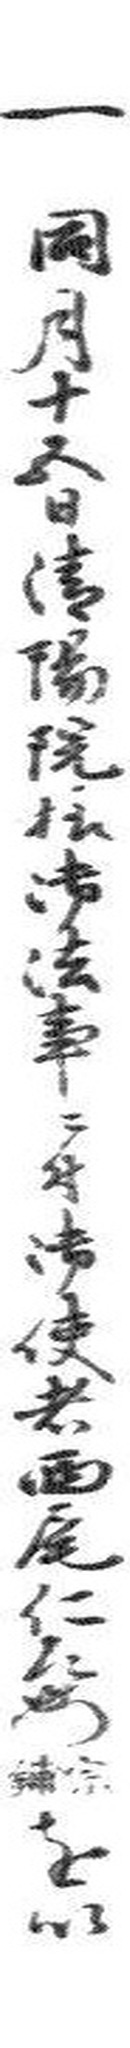一同月十五日清陽院様御法事ニ付御使者西尾仁左衛門宗輔を以
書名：家譜 二十八 吉邦公 従宝永七年七月五日到正徳元年十二月
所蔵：福井県文書館 Fukui Prefectural Archives
